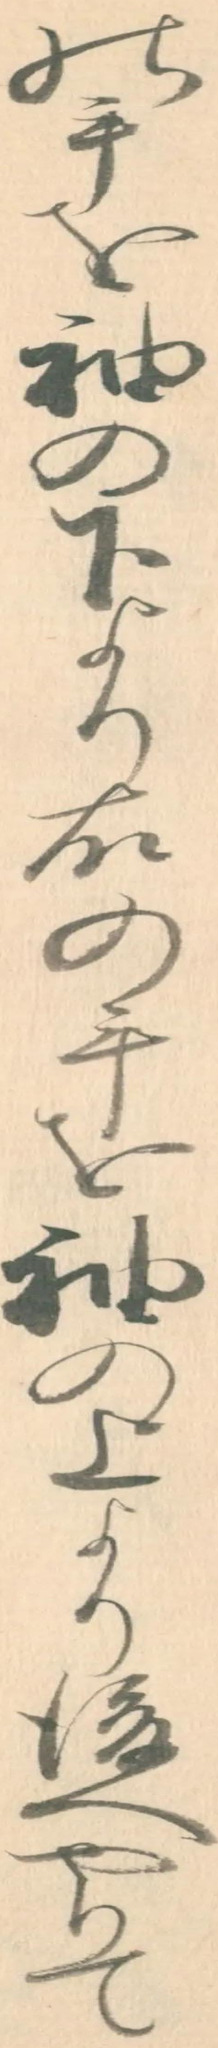の手を袖の下より右の手を袖の上より後へやりて
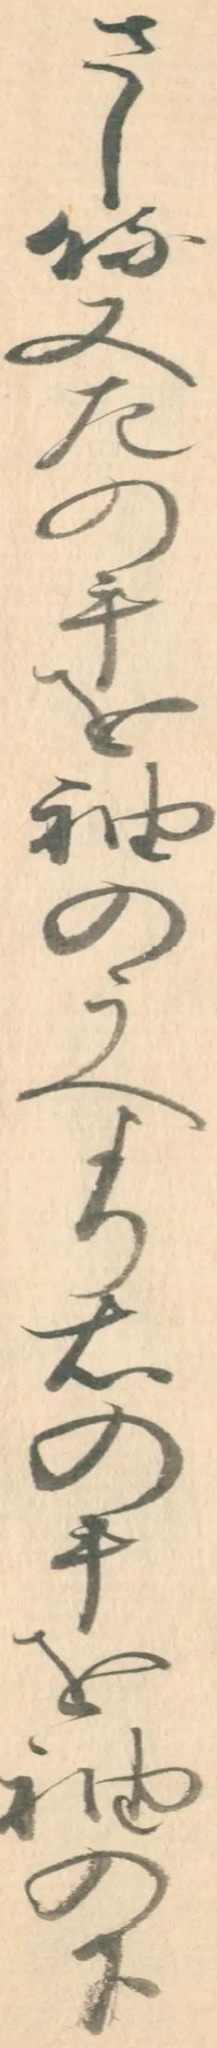さし侍又左の手を袖のうへより右の手を袖の下
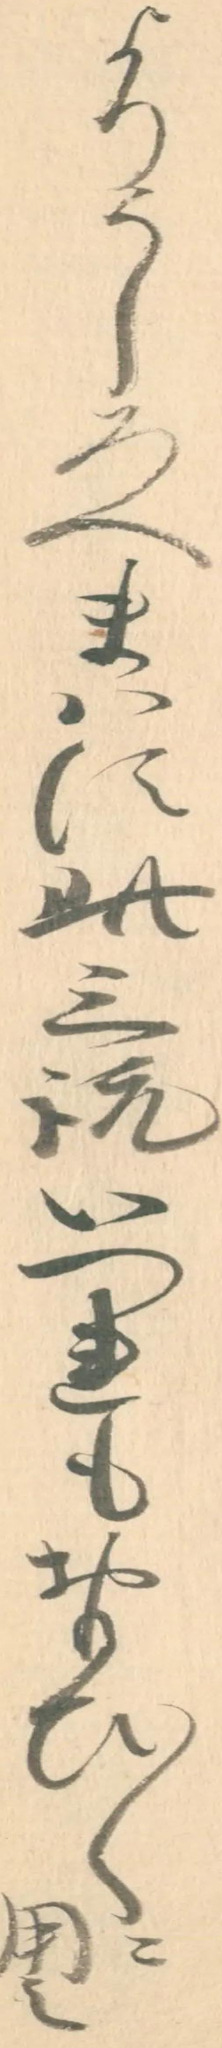よりうしろへまはす此三流いつれもおもひ〳〵に用之

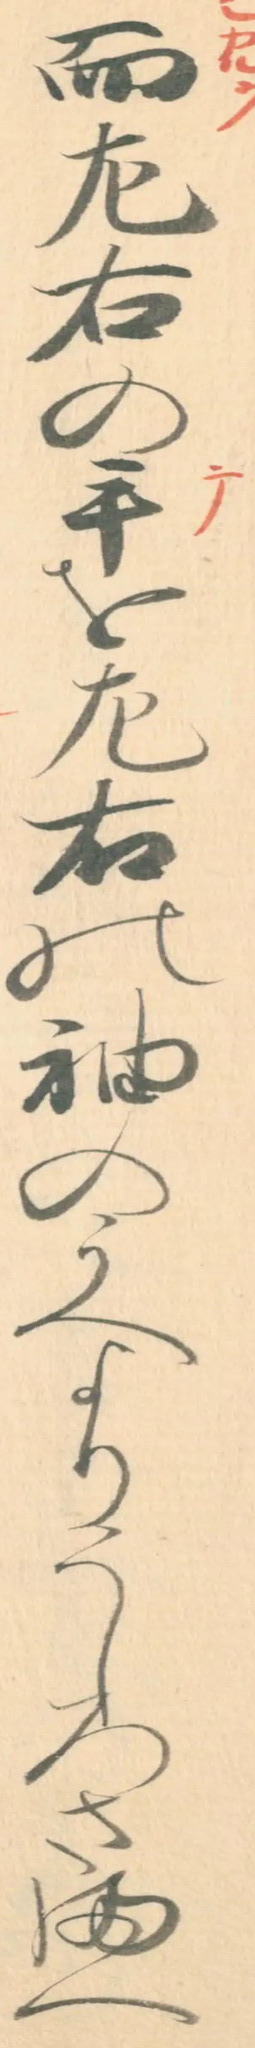而左右の手を左右の袖のうへよりうしろさまへ
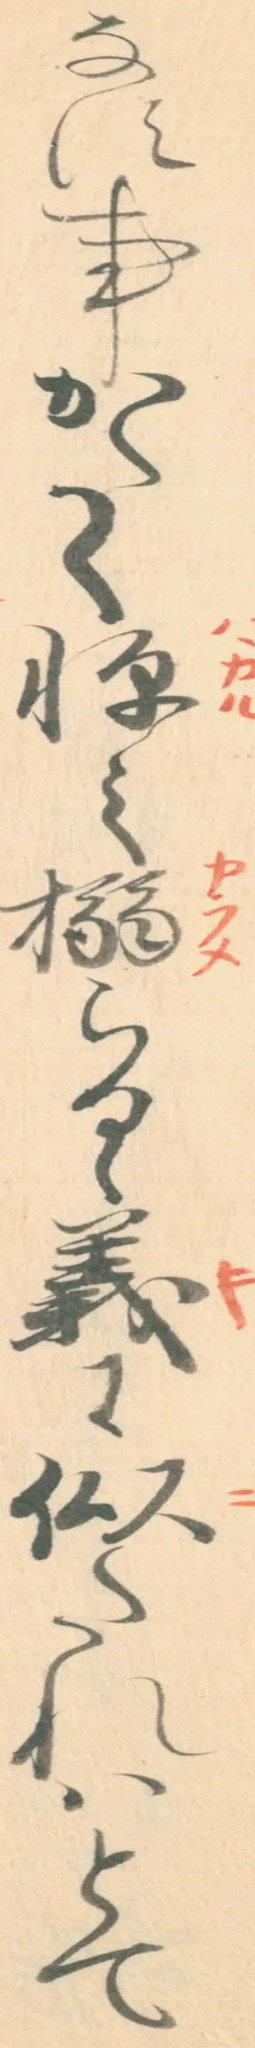なに事かた〳〵憚之搦らるゝ義に似たれはとて
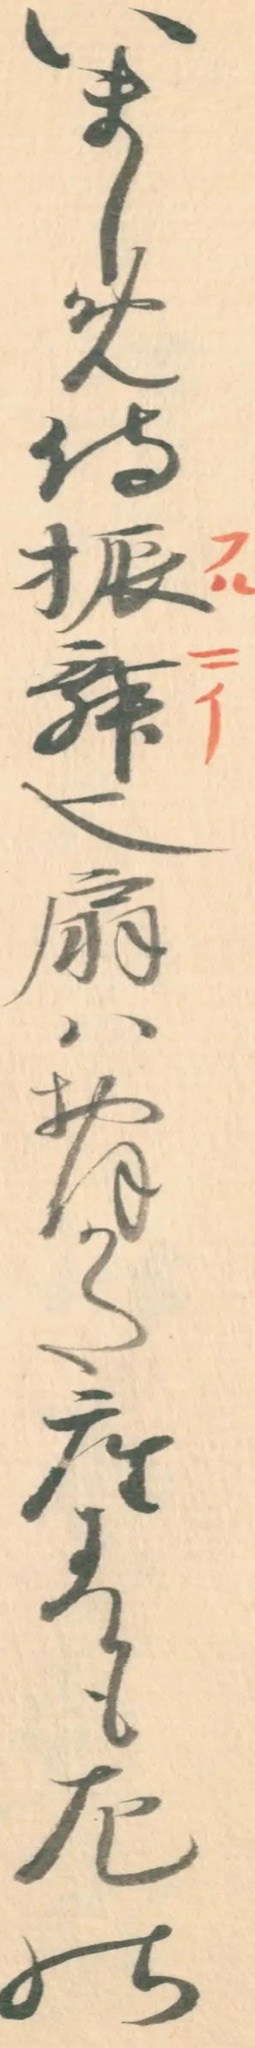いましめ侍振舞也扇はおほかた座も左の
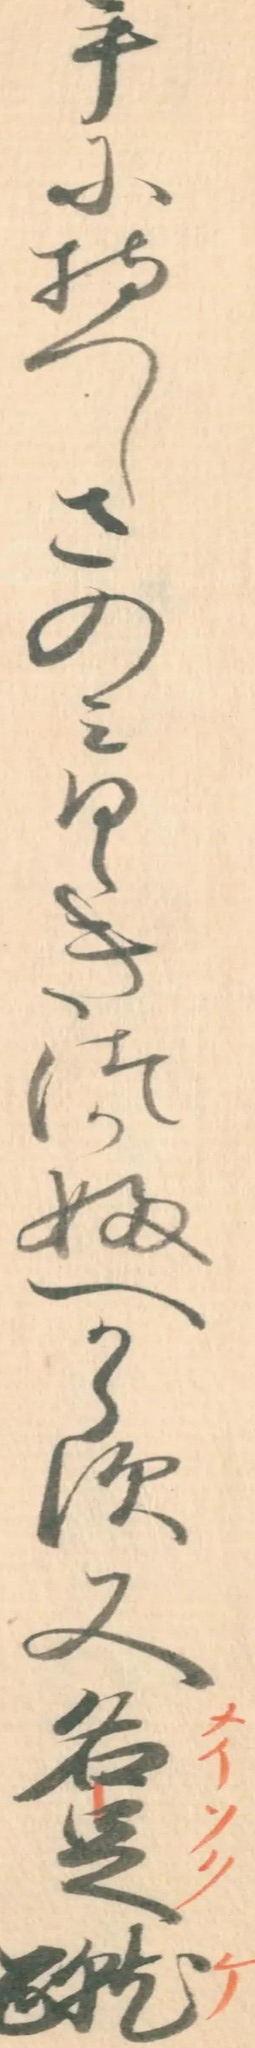手に持つしさのみ日たきつかふへからす名足蹴
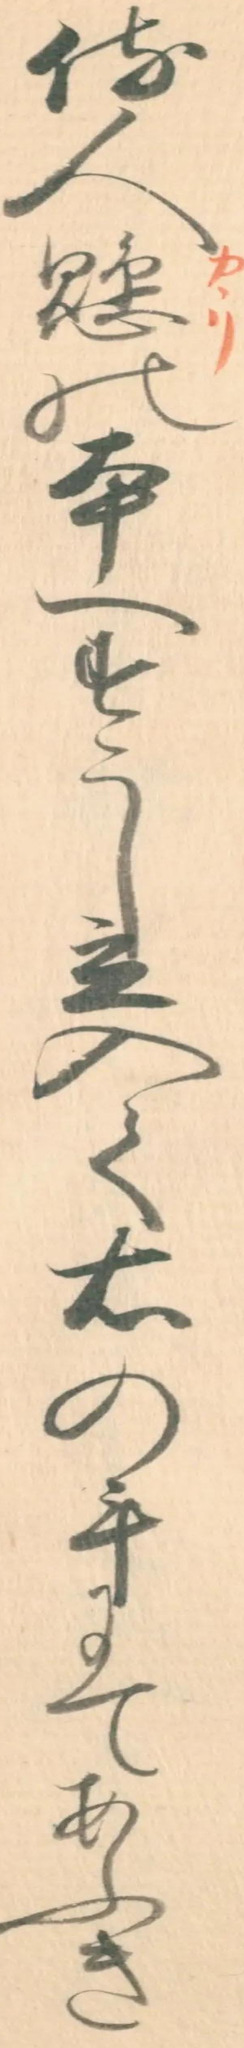侍人懸の本へすこし立入右の手にてあふき
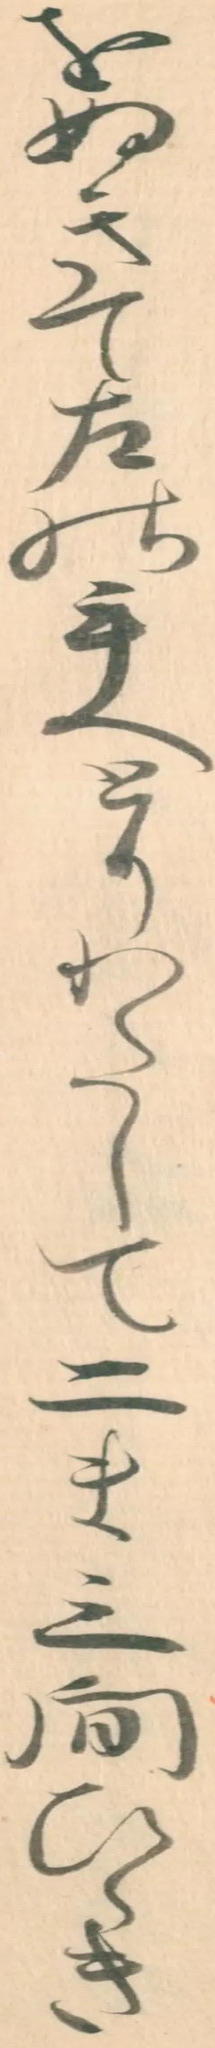あおぬきて左の手へとりわたして二ま三間ひらき
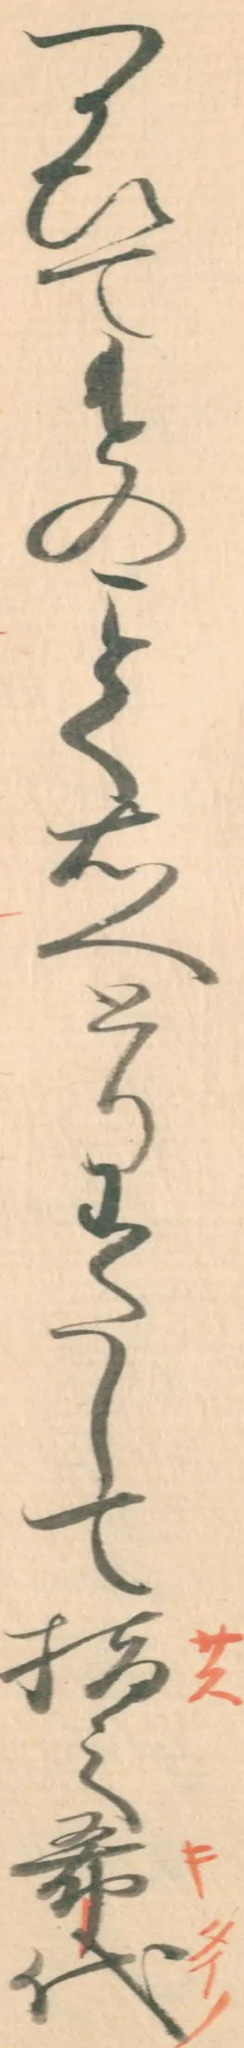つかひてもとのことく右へとりわたして指之希代
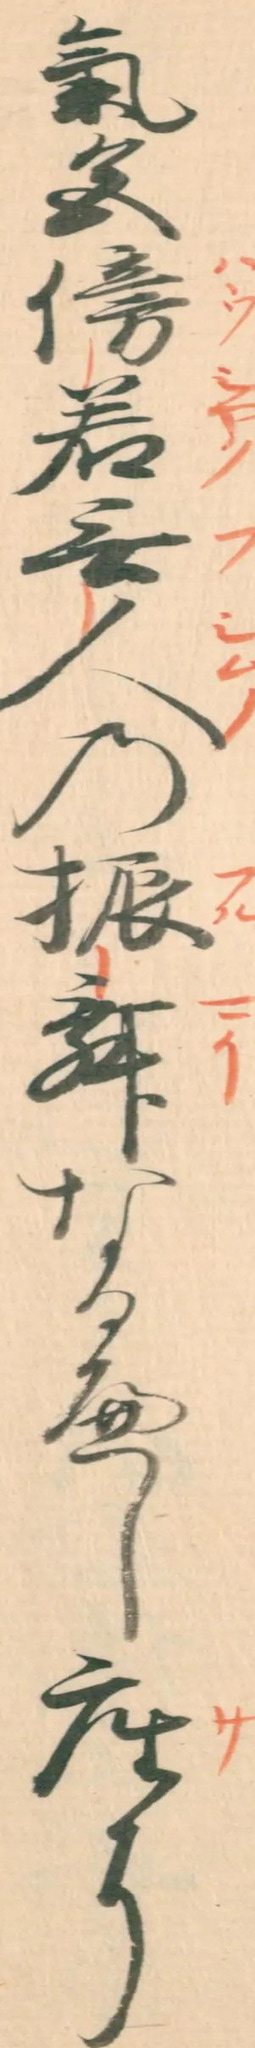氣色傍若無人の振舞なるへし座より
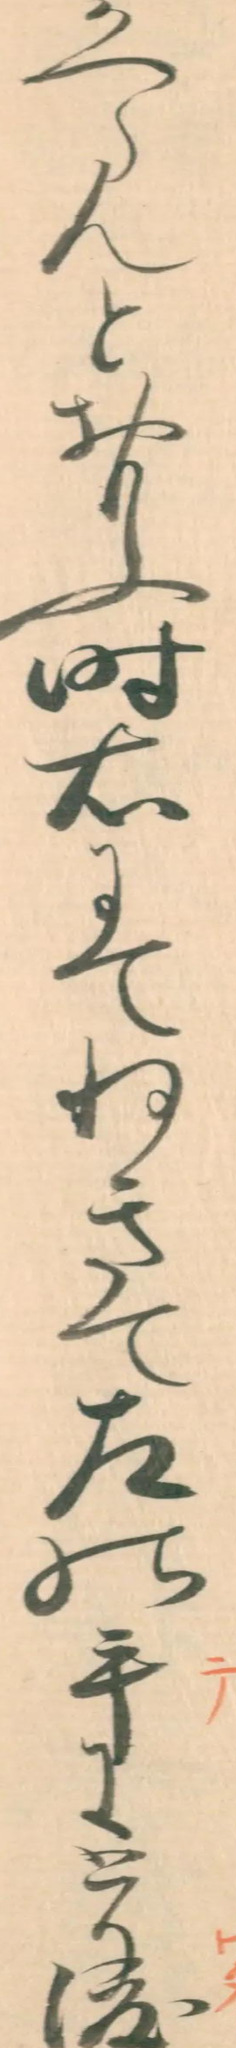かへらんとおもふ時右にてきて左の手にとり渡
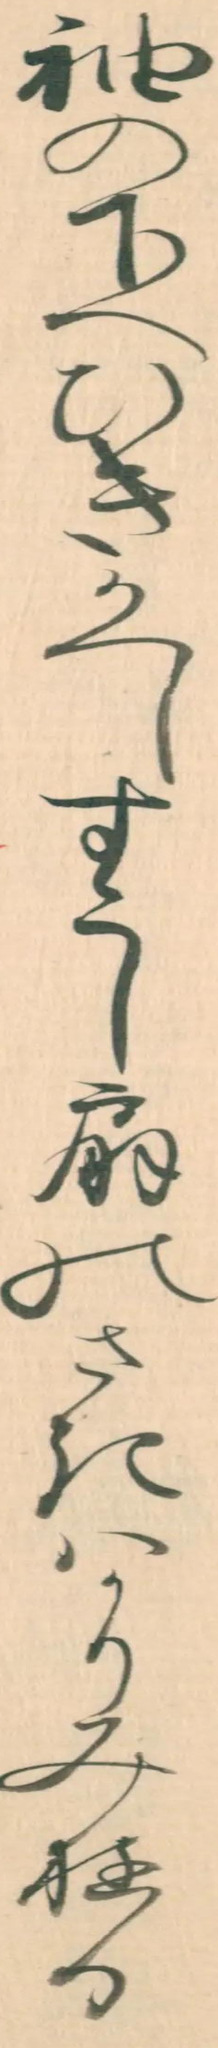袖の下へひきかへてすこし扇のさきはかりみる
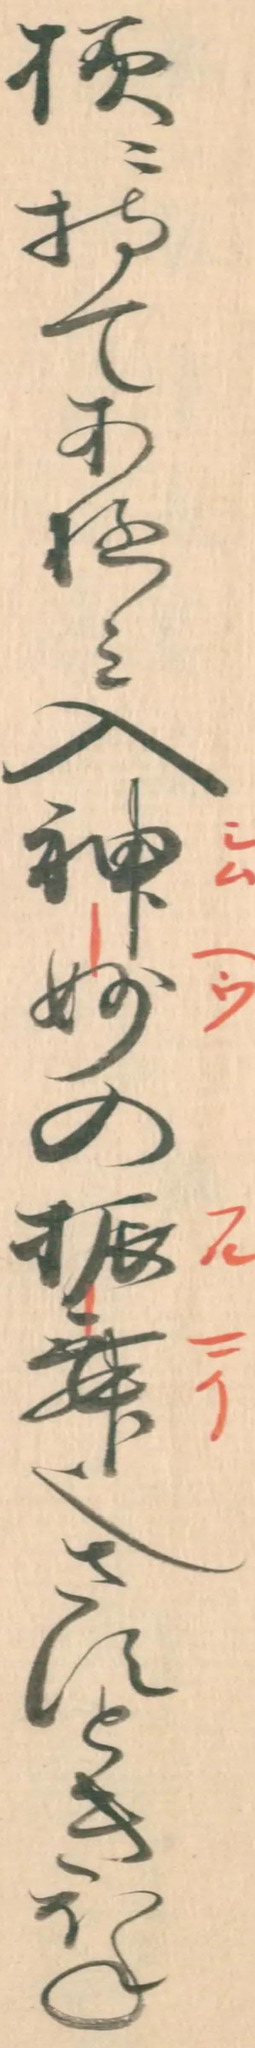様に持てあゆみ入神妙の振舞也さすときほね
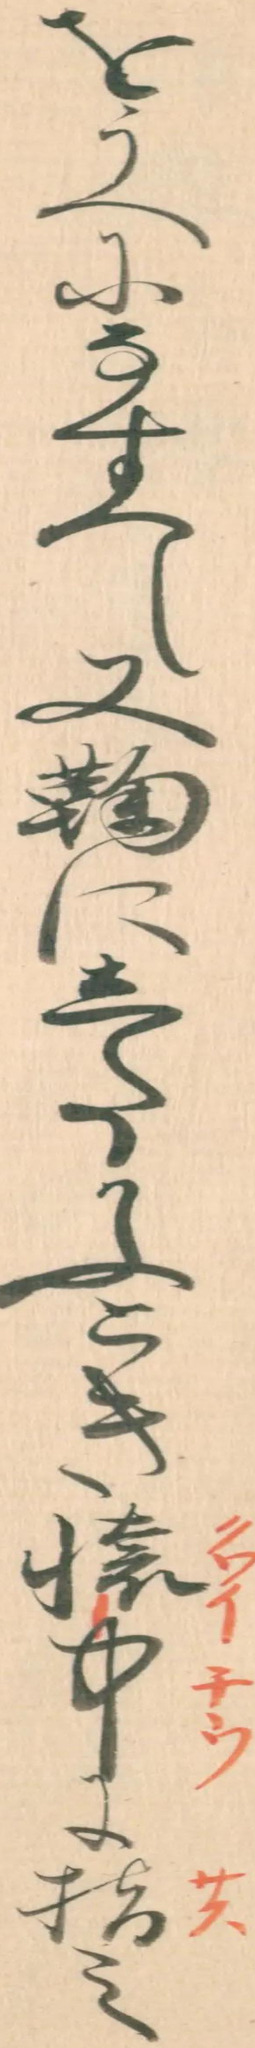をうへになすへし又鞠にしたかふとき懐中に指事
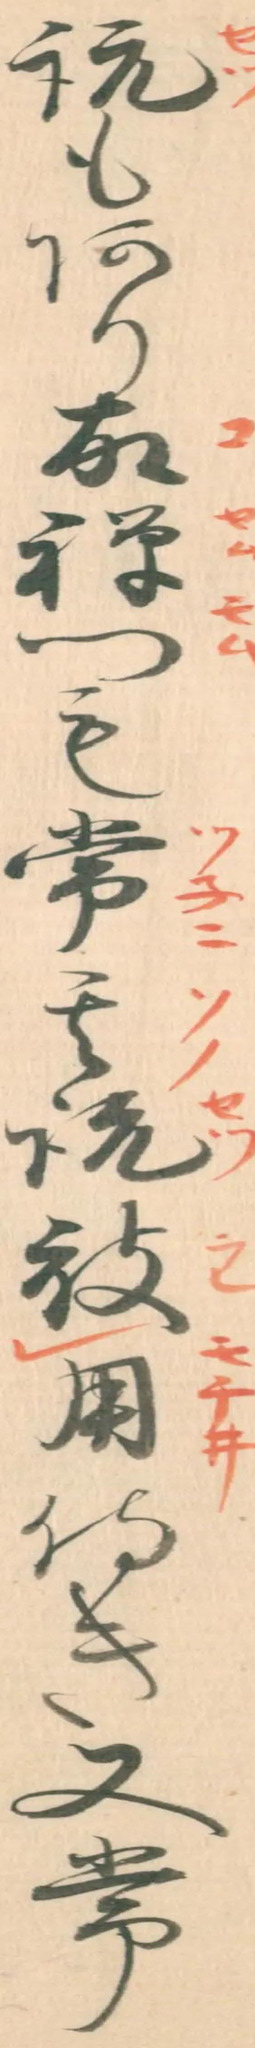説もあり故様も常其説被用侍き又常
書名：遊庭秘抄 2巻. [1]
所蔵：国立国会図書館 National Diet Library, JAPAN
